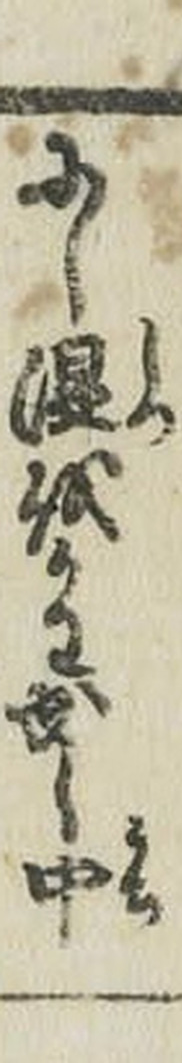にし湿をかわかし中
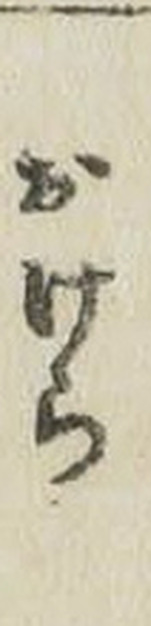おけら
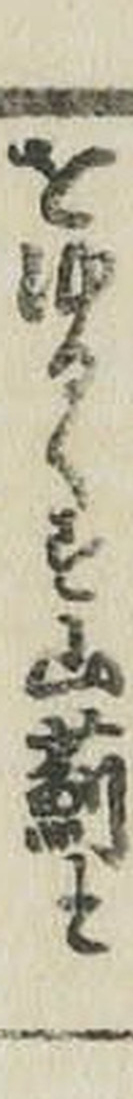をゆるくす山薊と
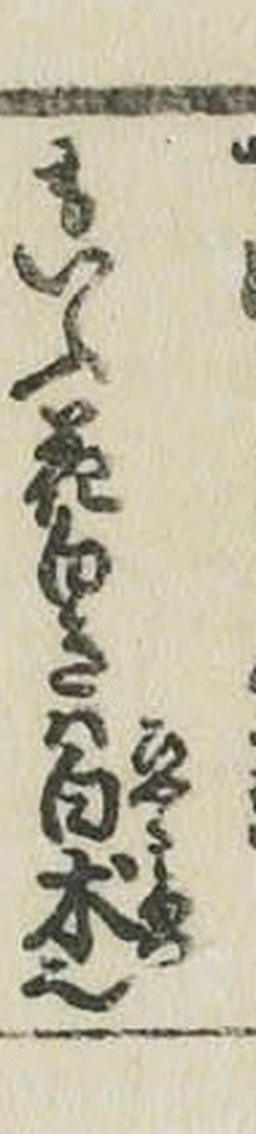もいふ花白きは白朮也
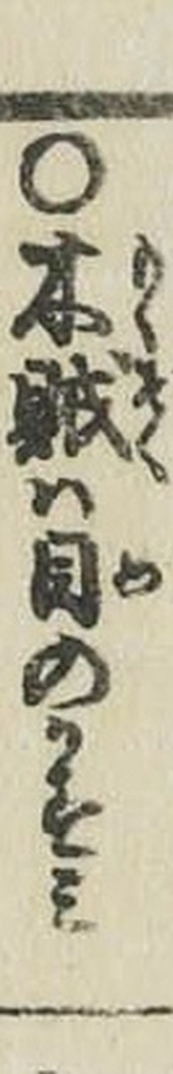○木賊は目のかすみ
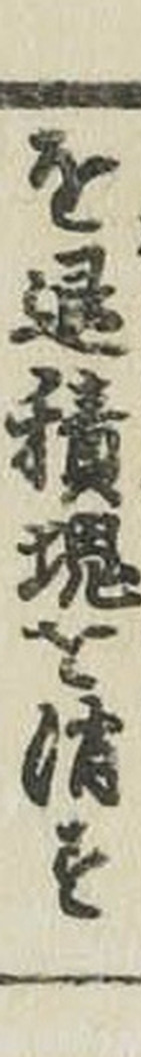を退積塊を消す
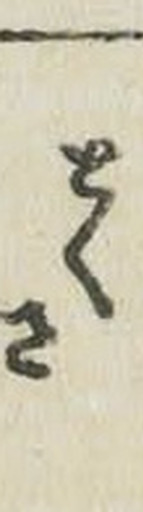とくさ
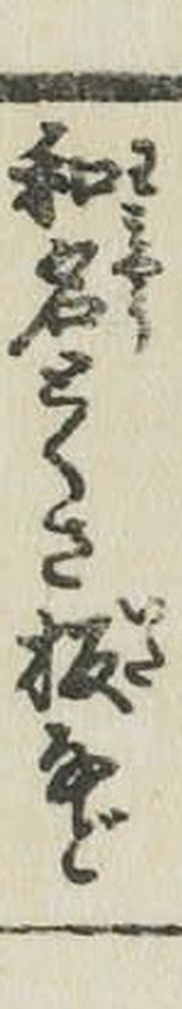和名とくさ板など
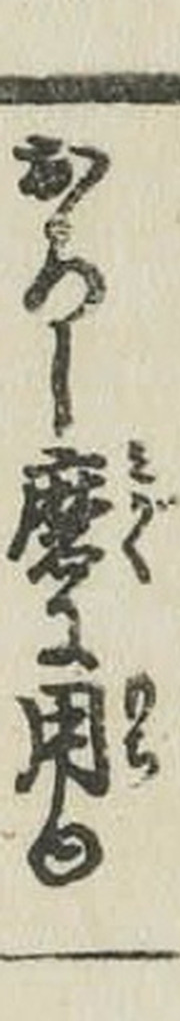おろし磨に用ゆ
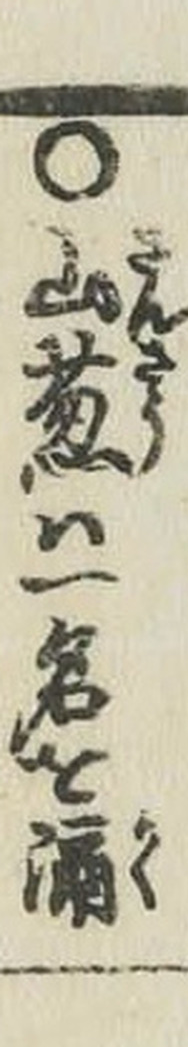○山葱は一名を隔
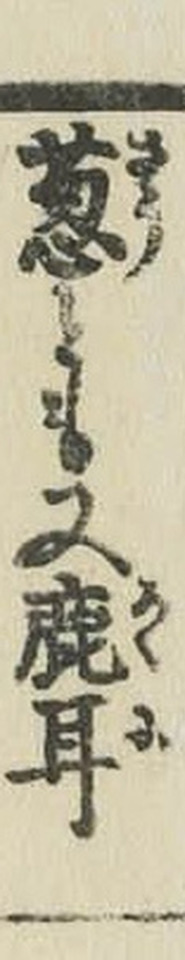葱とも又鹿耳
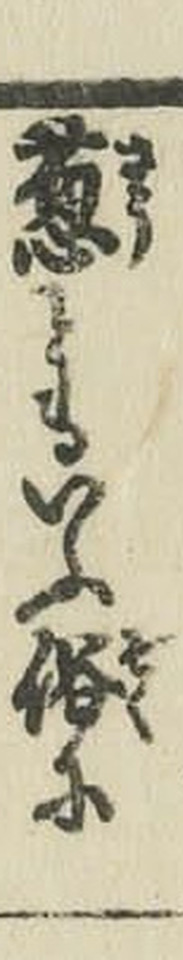葱ともいふ俗に
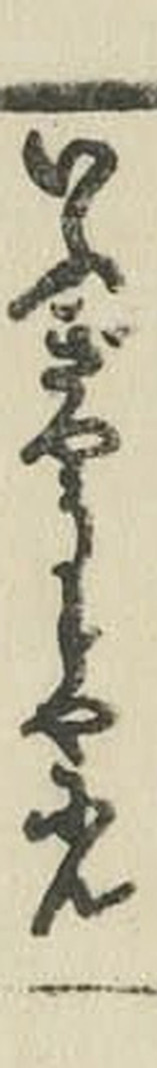いふぎやうしやにん
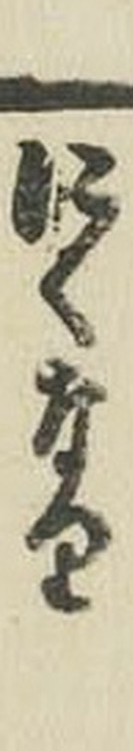にくなり
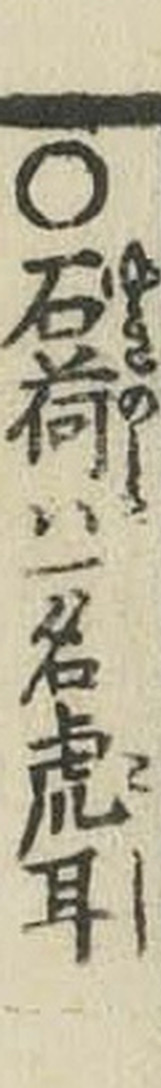○石荷は一名虎耳
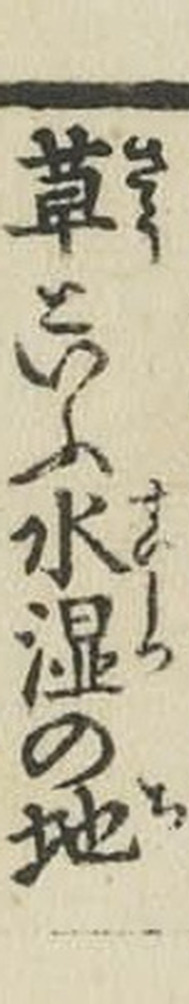草といふ水湿の地
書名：増補頭書訓蒙図彙大成 10巻 9:巻之20
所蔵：東京学芸大学教育コンテンツアーカイブ
